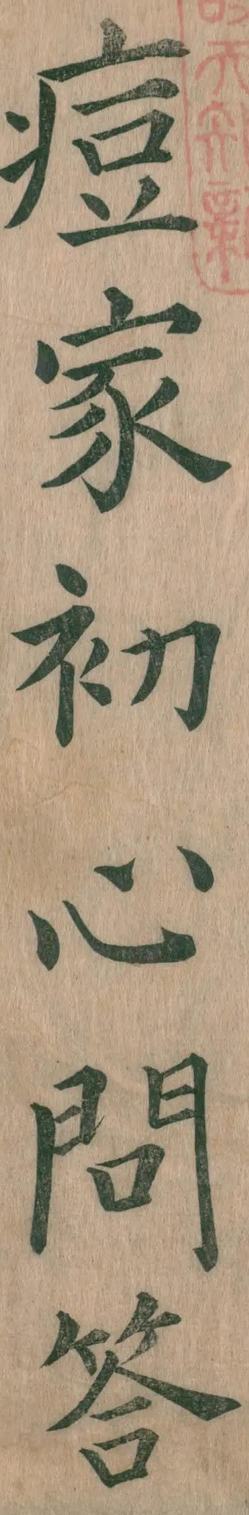痘家初心問答
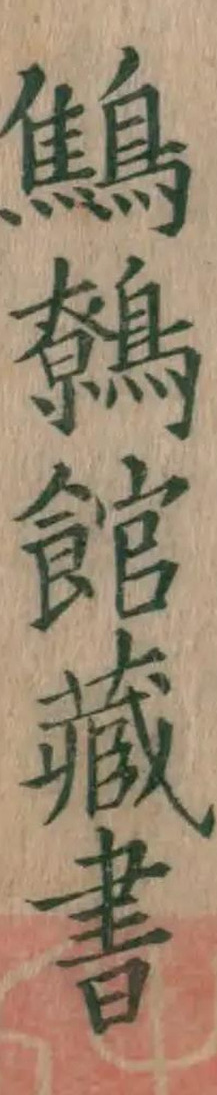鷦鷯館蔵書
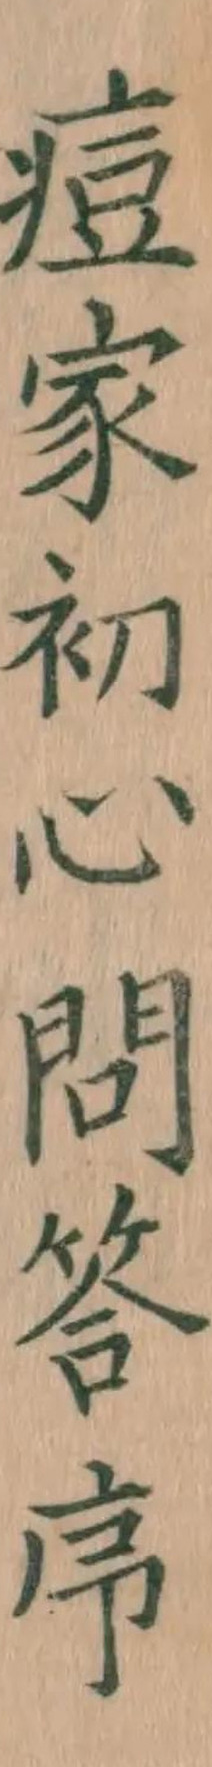痘家初心問答序

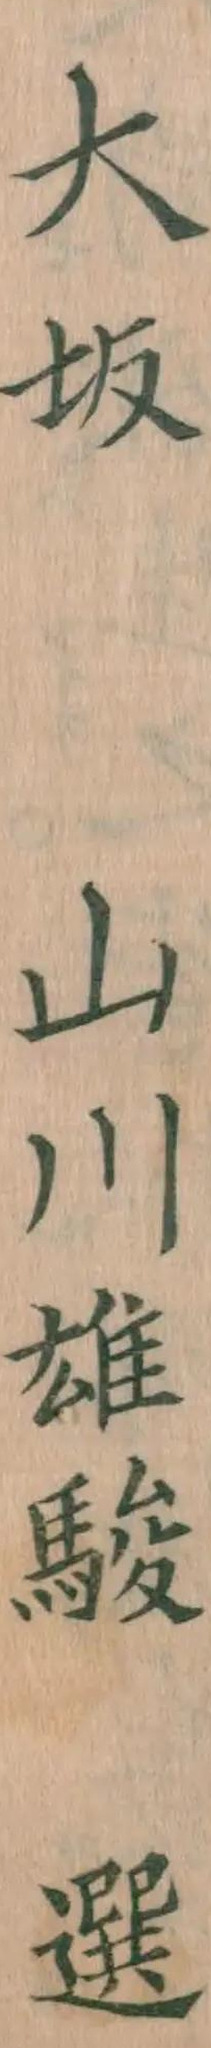大坂山川雄駿選
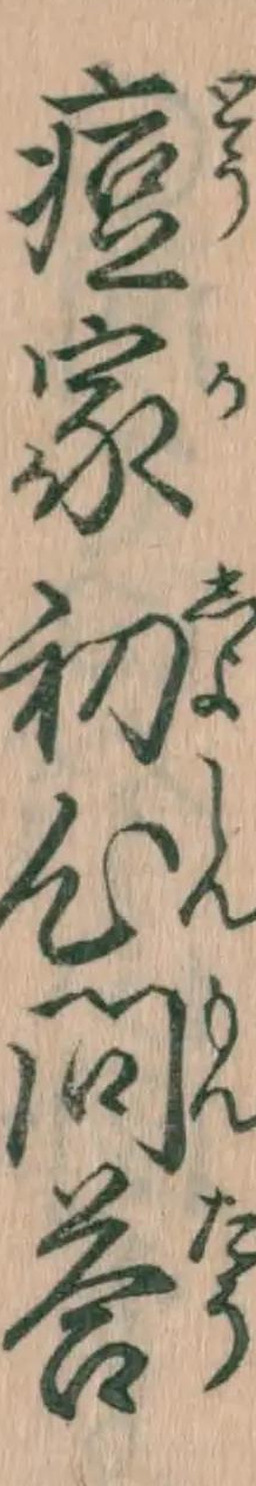痘家初心問答
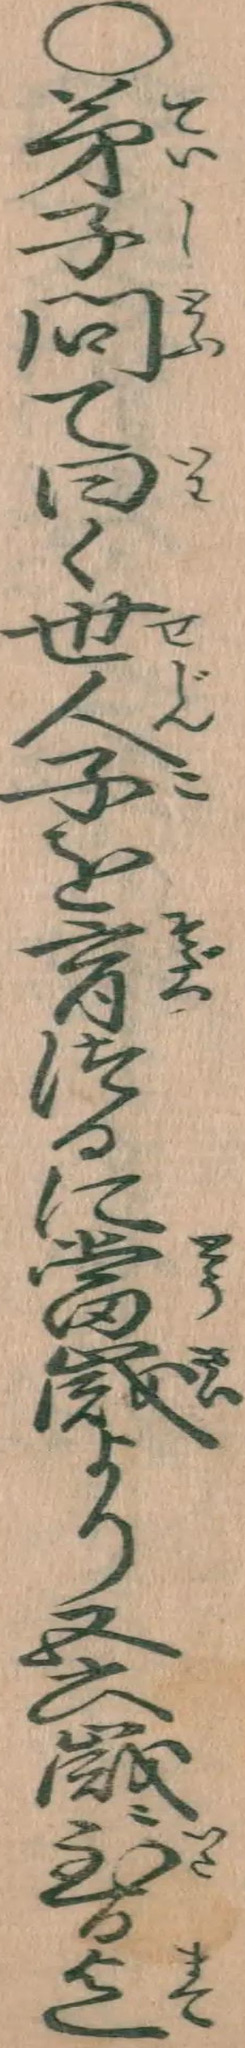○弟子問て曰く世人子を育つるに当歳より五六歳に至る迄
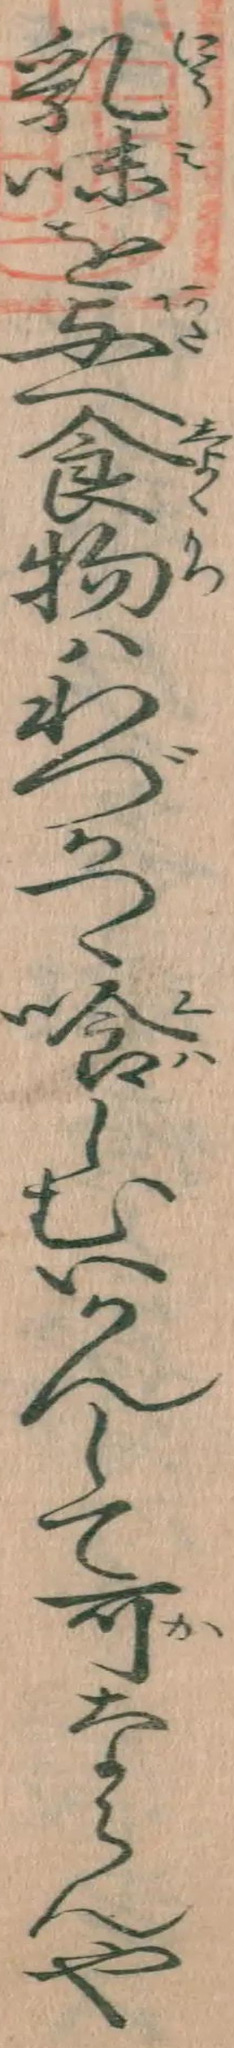乳味を与へ食物はわづかつゝ喰しむいかんして可ならんや
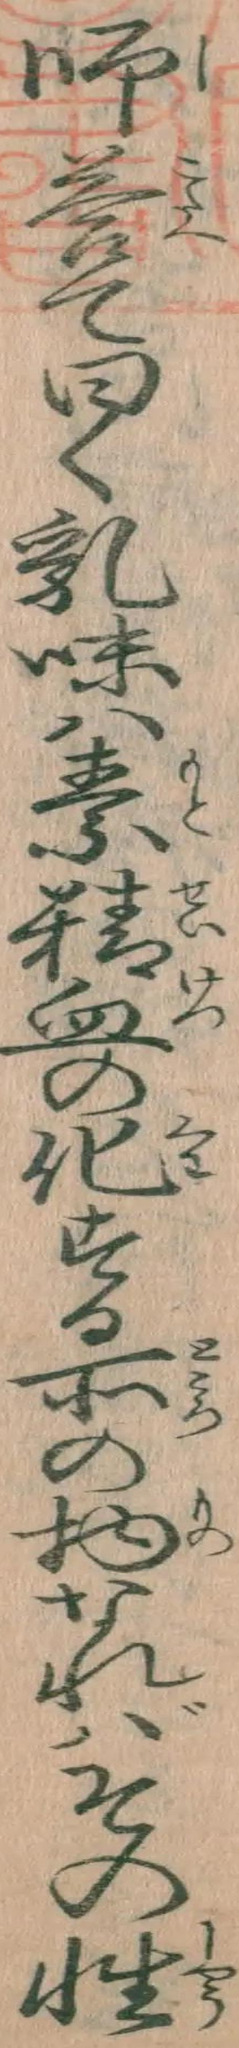師答て曰く乳味は素精血の化する所の物なればその性
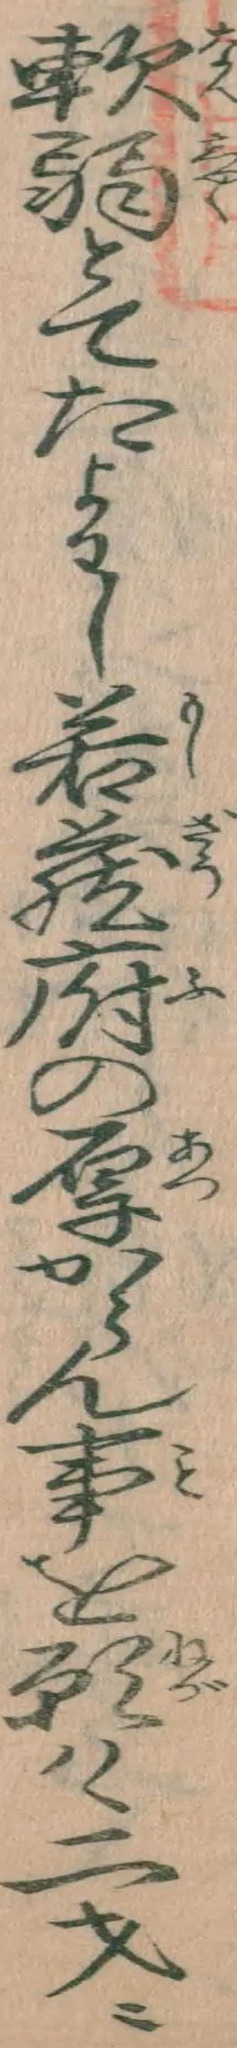軟弱とてたよわし若蔵府の厚からん事願はゝ二才に
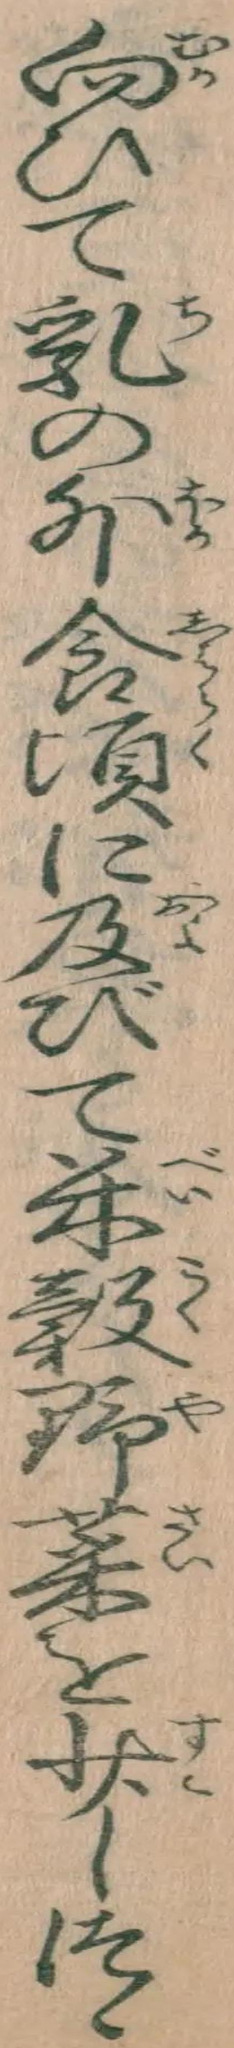向ひて乳の外食頃に及びて米穀野菜を少しつゝ
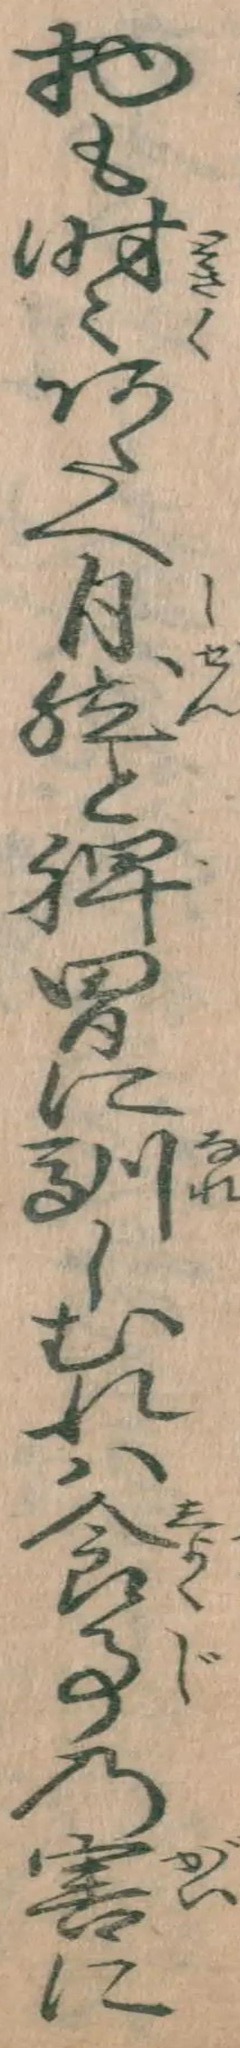物も時々あたへ自然と脾胃に馴しむれは食事の害に

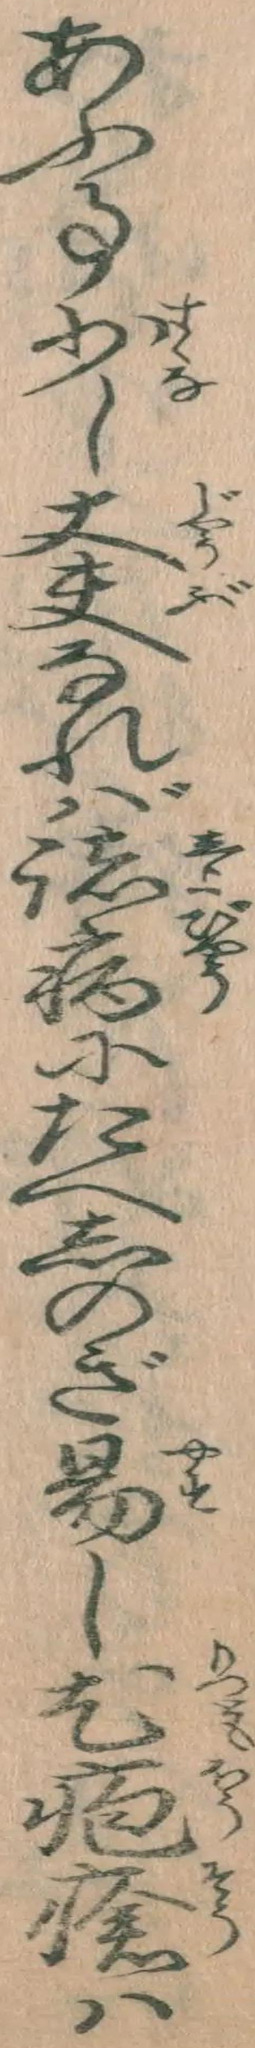あふ事少し丈夫なれば諸病にたへしのぎ易し尤疱瘡は
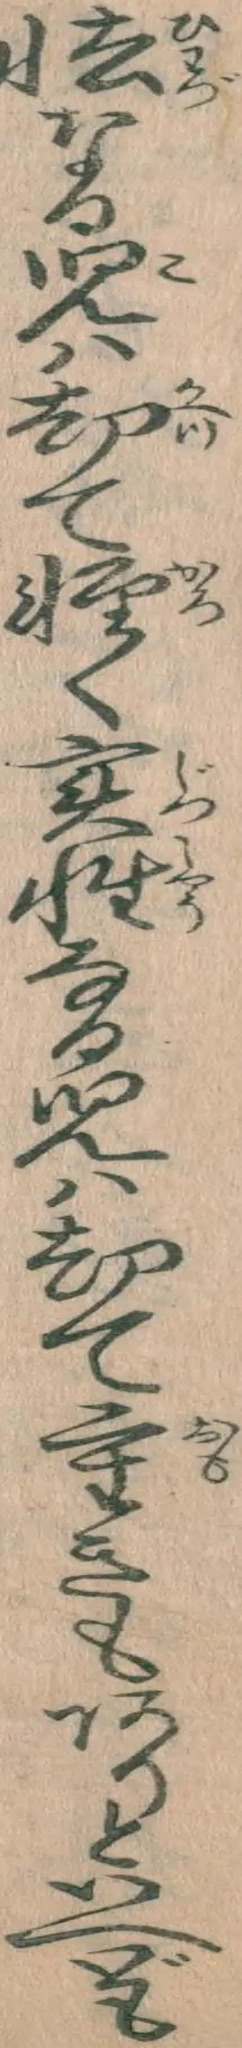怯なる児は却て軽く実性なる児は却て重きもありといへども
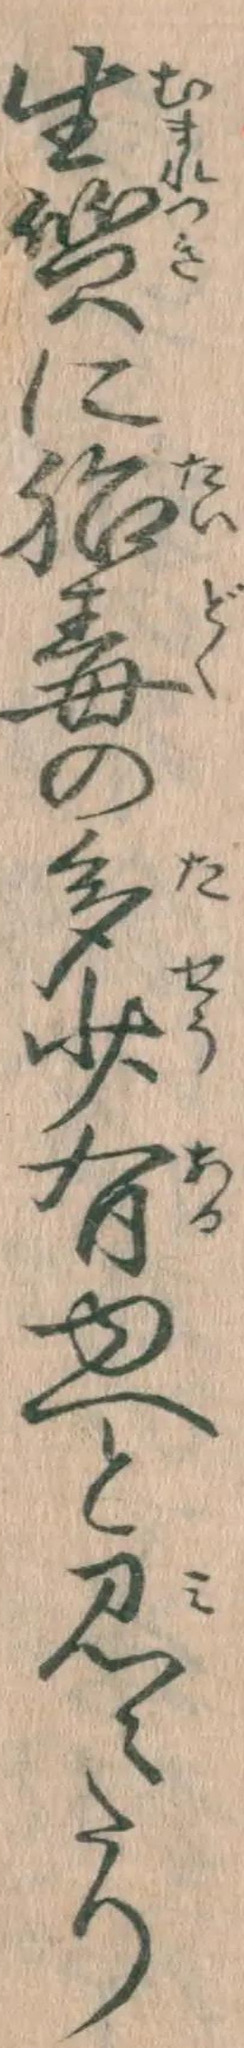生質に胎毒の多少有ゆへと見えたり
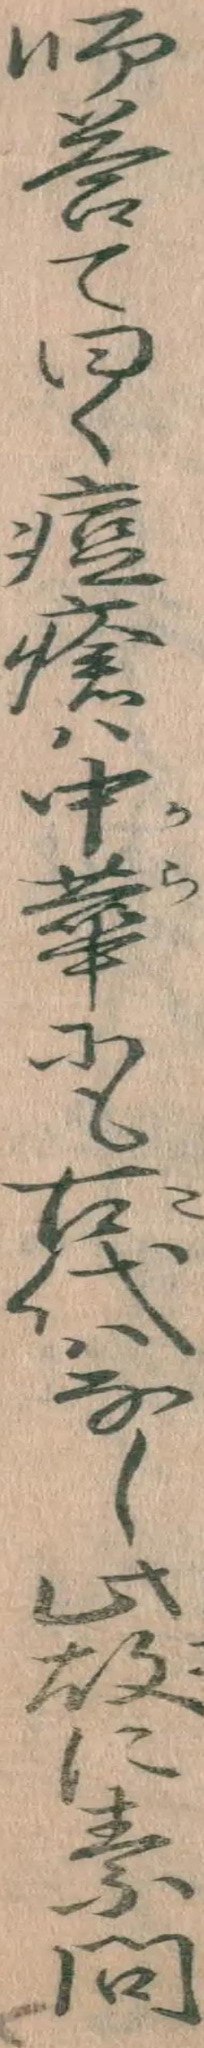師答て曰く痘瘡は中華にも古代はなし此故に素問
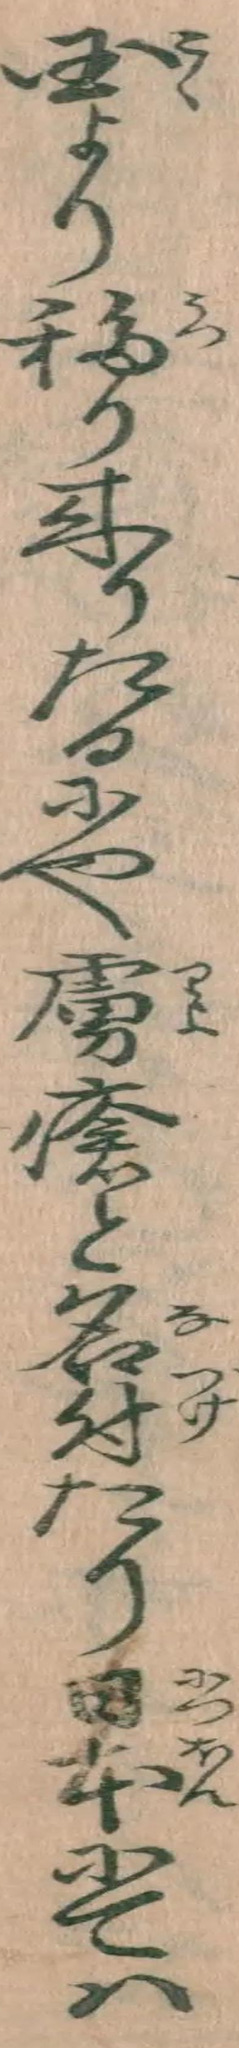国より移り来りたるにや虜瘡と名付たり日本にては
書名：痘家初心問答
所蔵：国立国会図書館 National Diet Library, JAPAN
